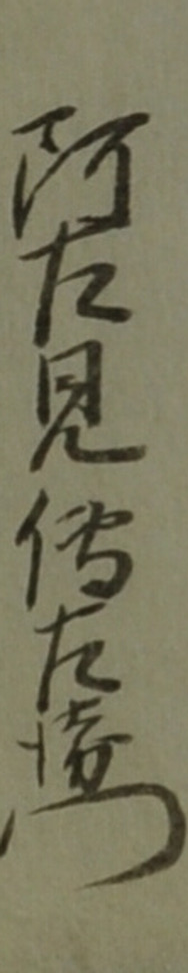阿左見伝左衛門
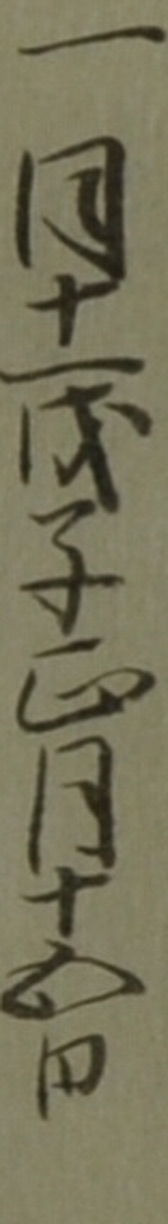一同十一戊子正月十五日
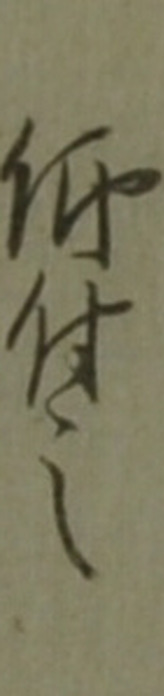仰付之
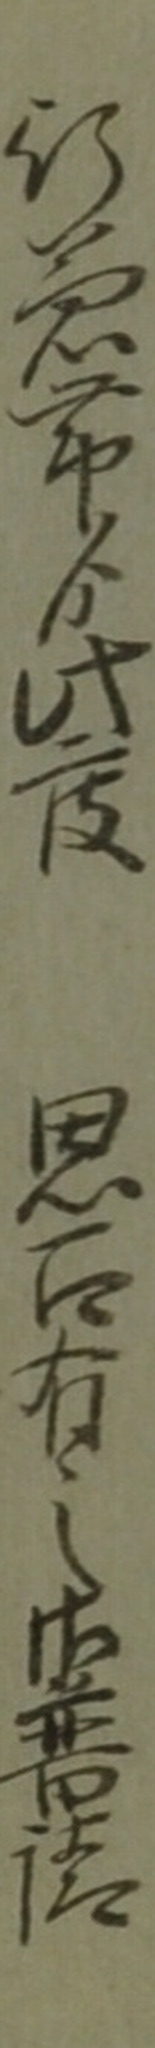行兼帯ゟ此度思召有之御普請
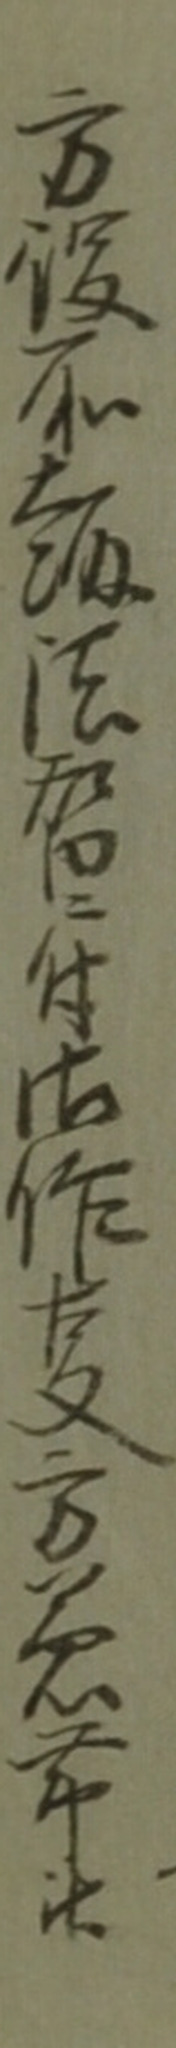方役所趣法替ニ付御作事方兼帯被
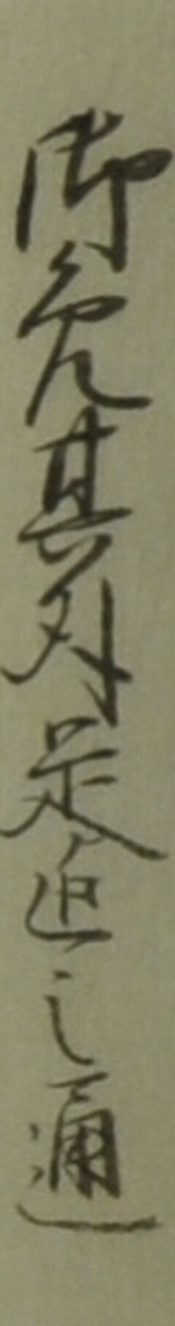御免其外是迄之通
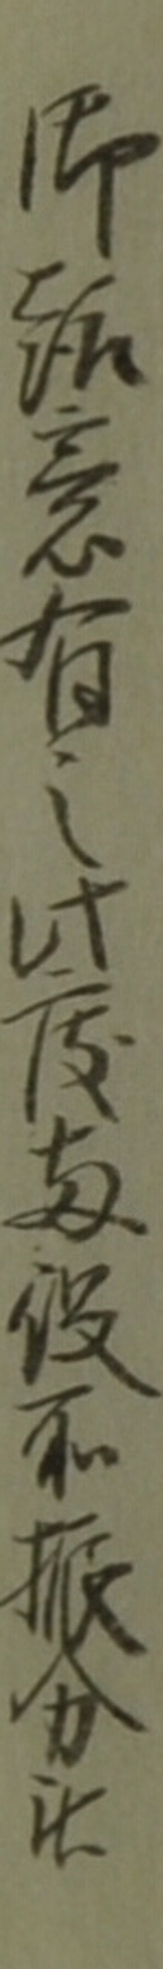御趣意有之此度両役所振分被
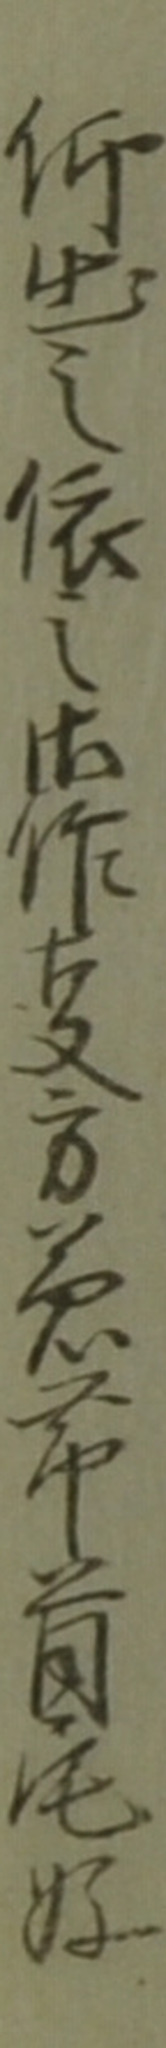仰出之依之御作事方兼帯首尾好

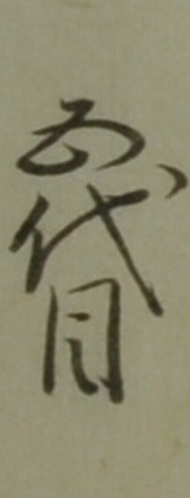五代目
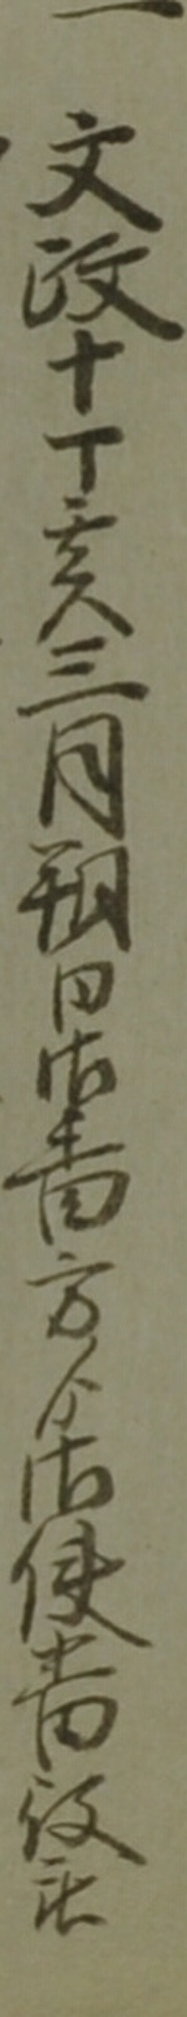一文政十丁亥三月朔日御番方ゟ御使番役被
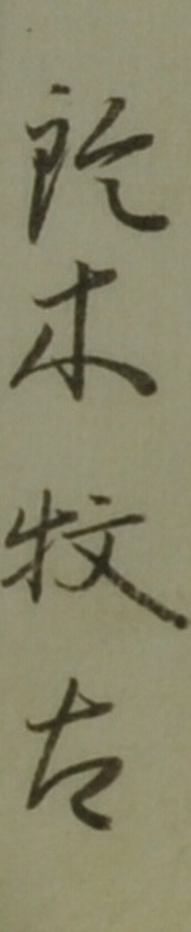鈴木牧太
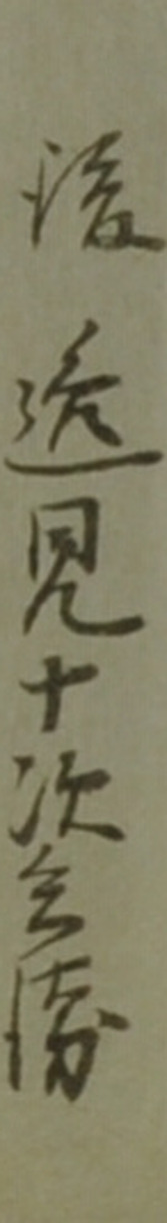後辺見十次兵衛
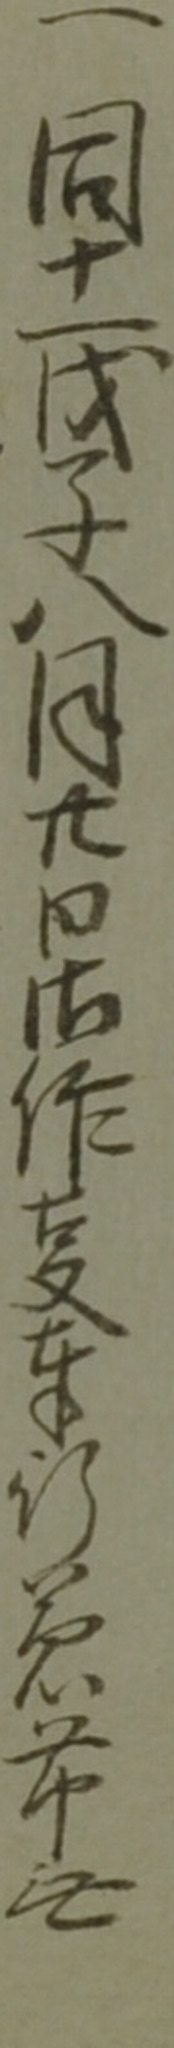一同十一戊子八月廿日御作事奉行兼帯無
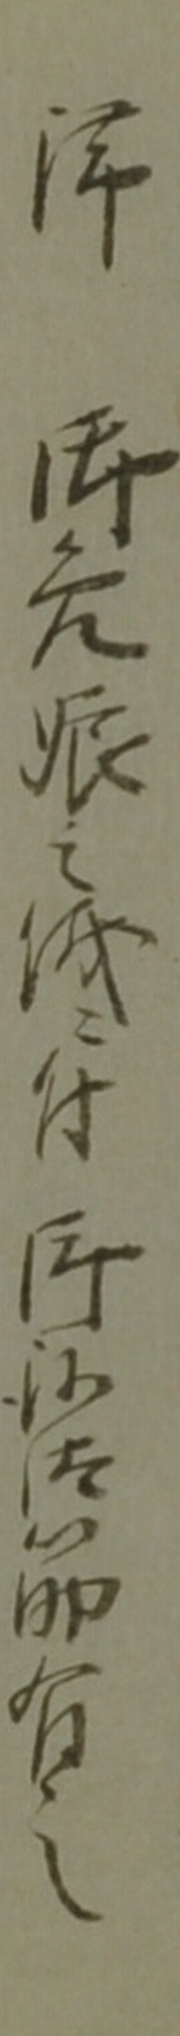滞御免◻︎之儀ニ付御沙汰筋有之
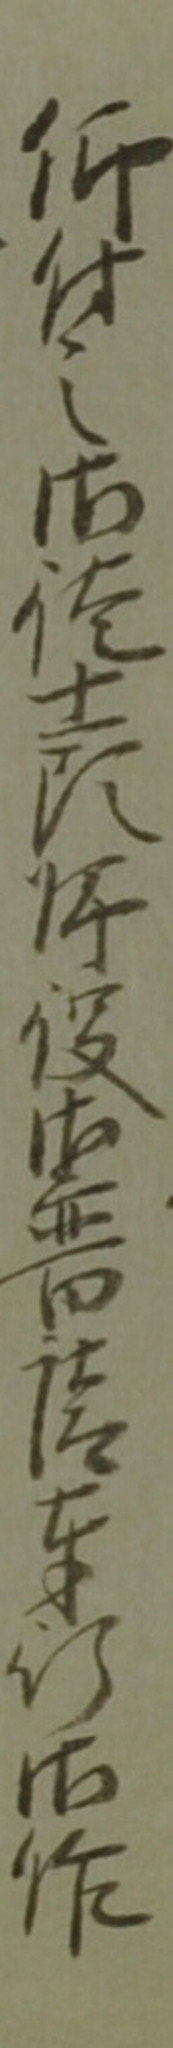仰付之御徒士頭帰役御普請奉行御作
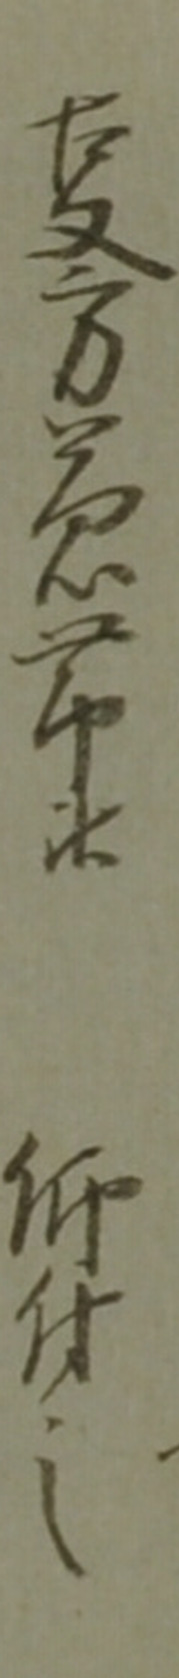事方兼帯被仰付之
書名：諸御役代々録（六）
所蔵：伊那市立高遠町図書館・合同会社AMANE
